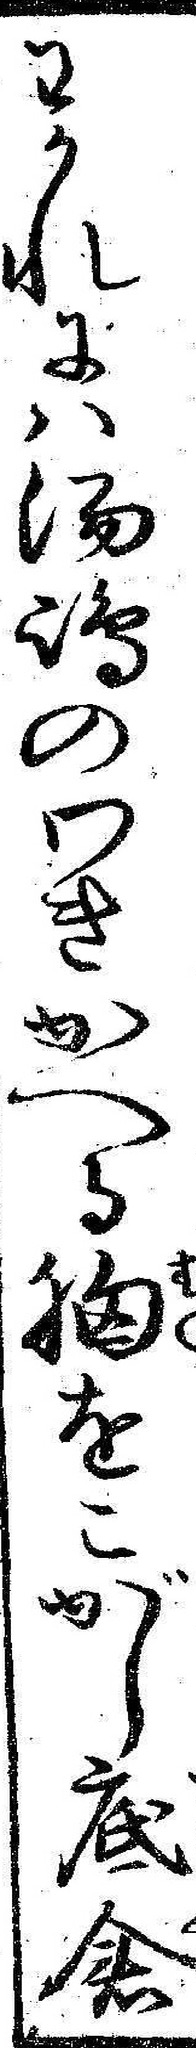わかれには酒島のわきかへる胸をこがし底倉

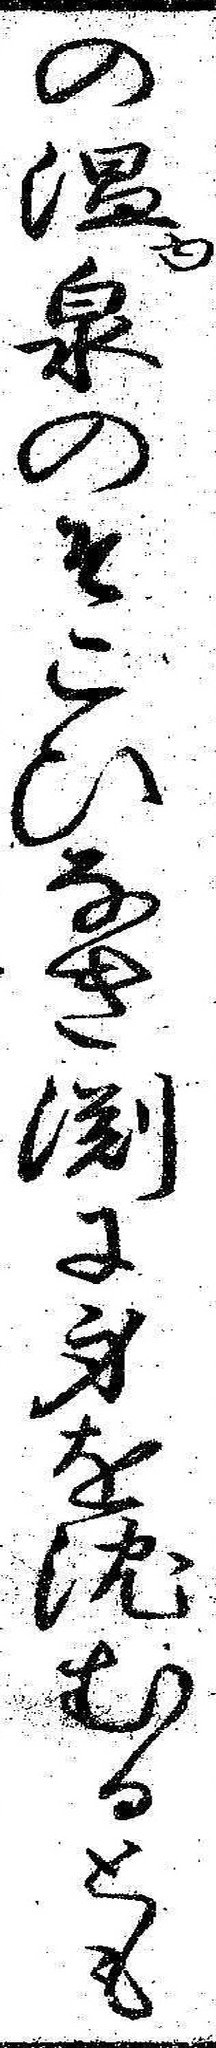の温泉のそこひなき淵に身を沈むるとも
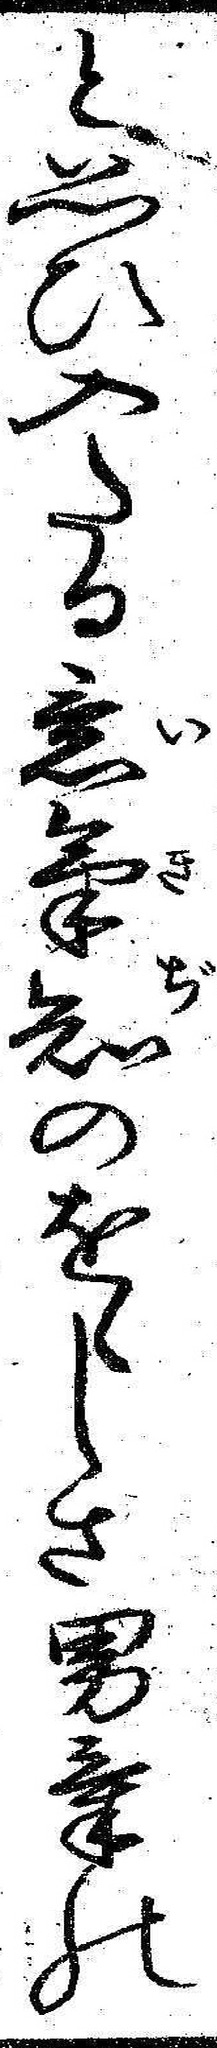と思ひ入たる意気知のをゝしさ男気の
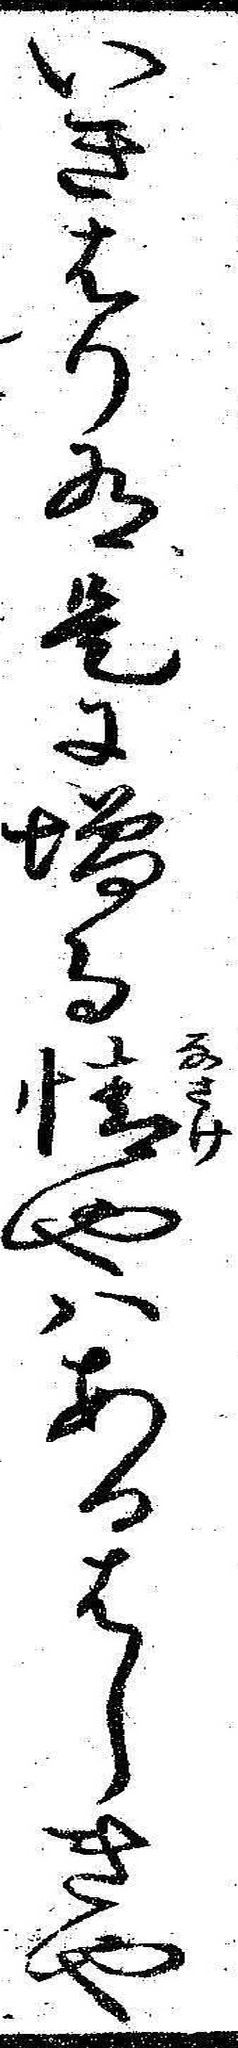いきはり有是に増る情やはあるはしきや
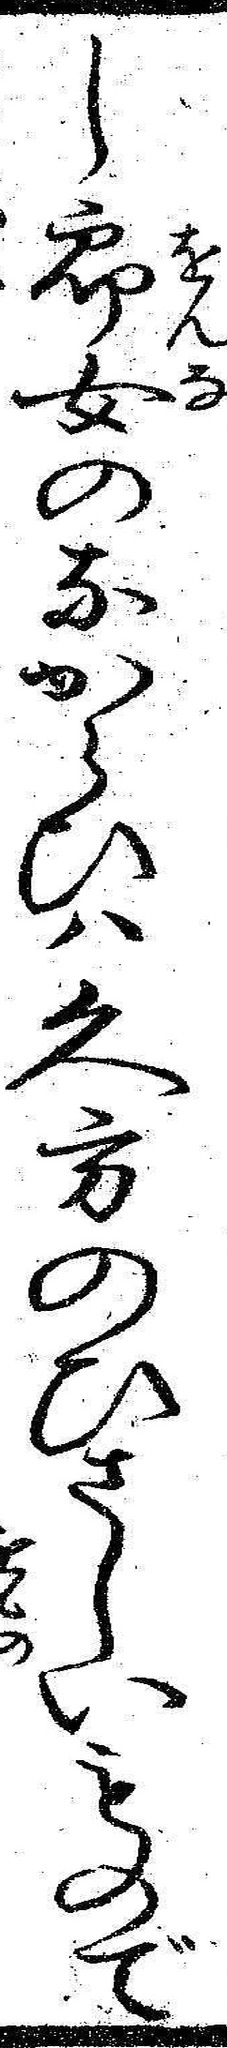し郎女のなからひは久方のひさしいもので
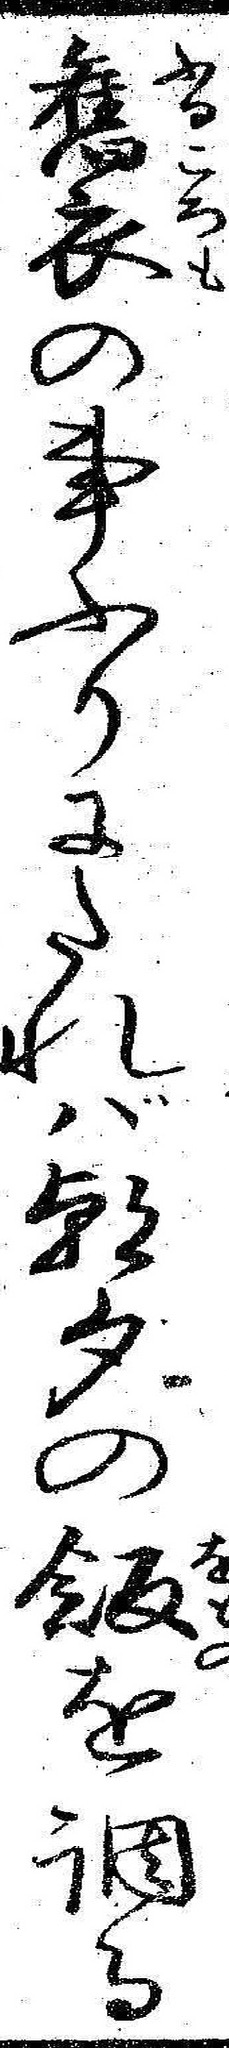舊衣の事ふりにたれば朝夕の飯を調る
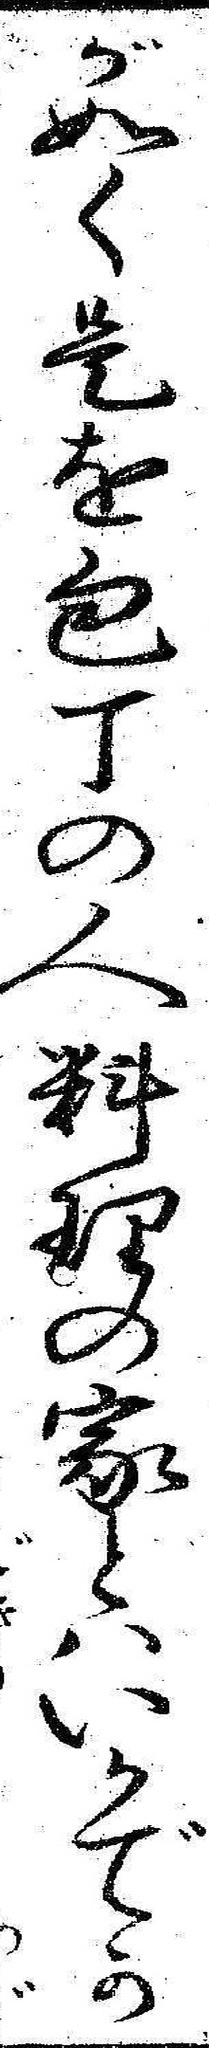が如く是を包丁の人料理の家とはいかでか
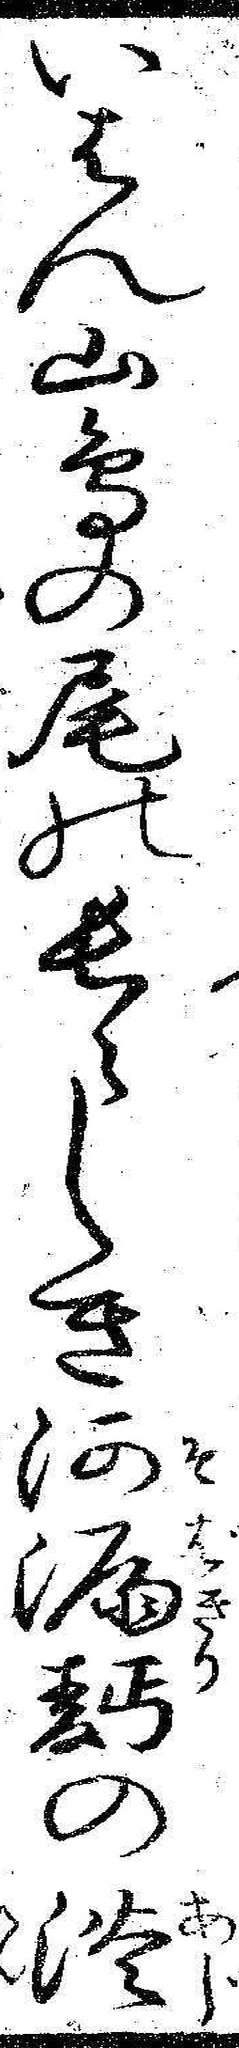いはん山鳥の尾の長らしき河漏麺の淡
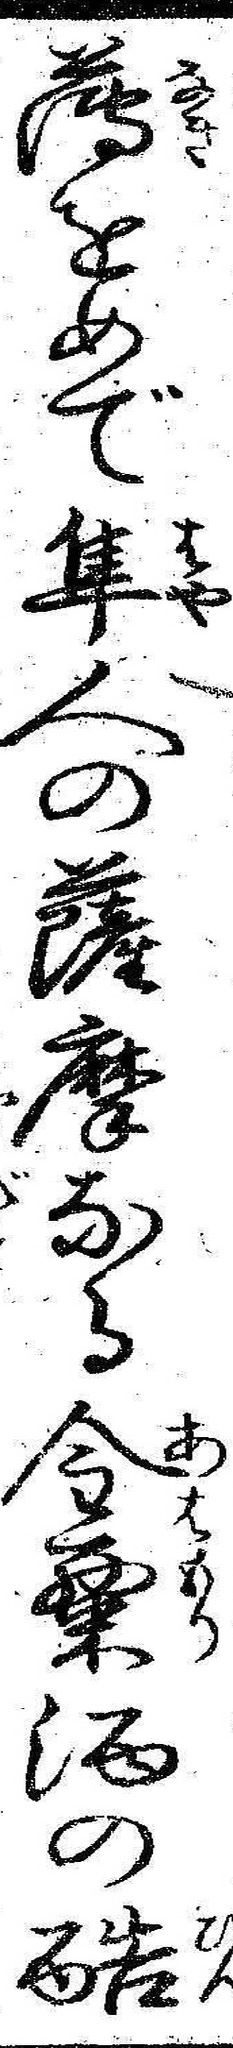薄をめで隼人の薩摩なる金栗酒の酷
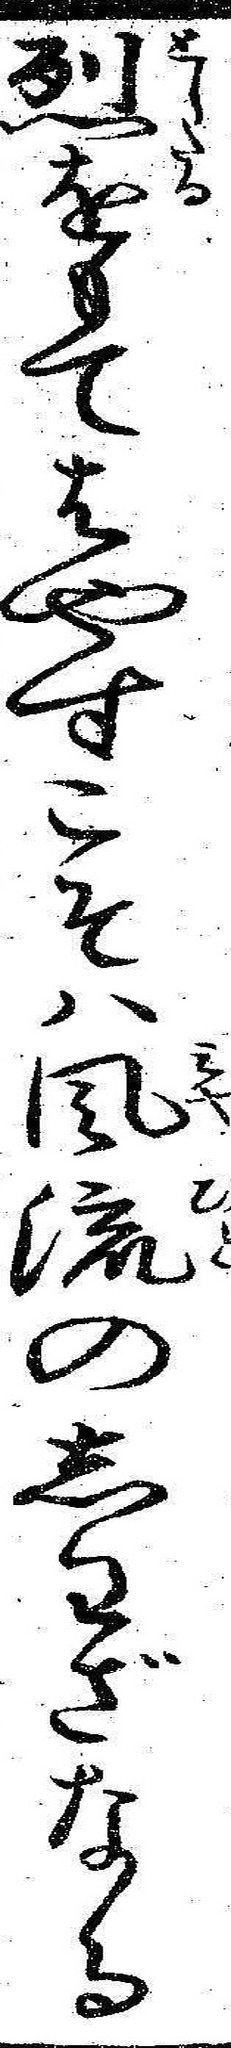烈をもてはやすこそは風流のしわざなる
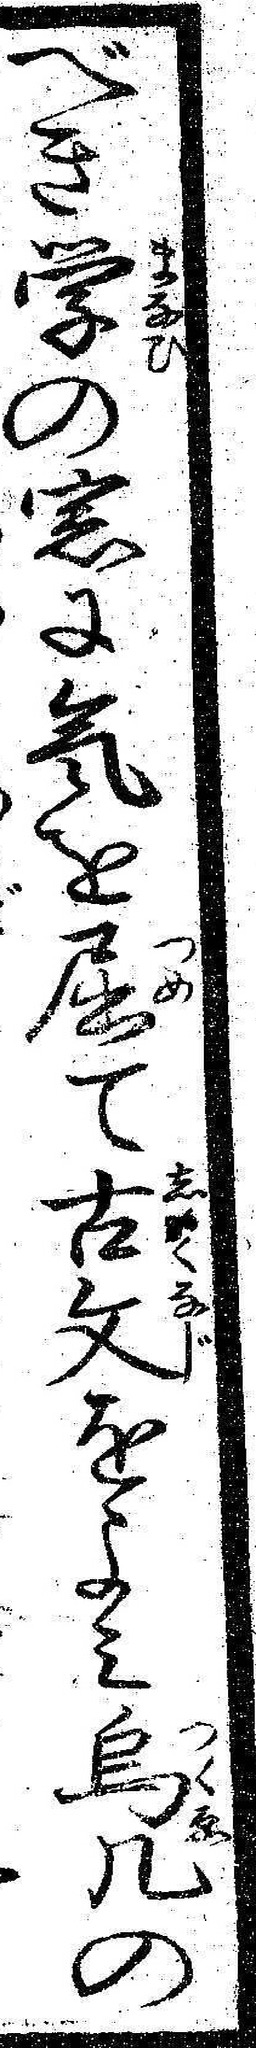べき学のに窓に気を屈て古文をよみ烏几の
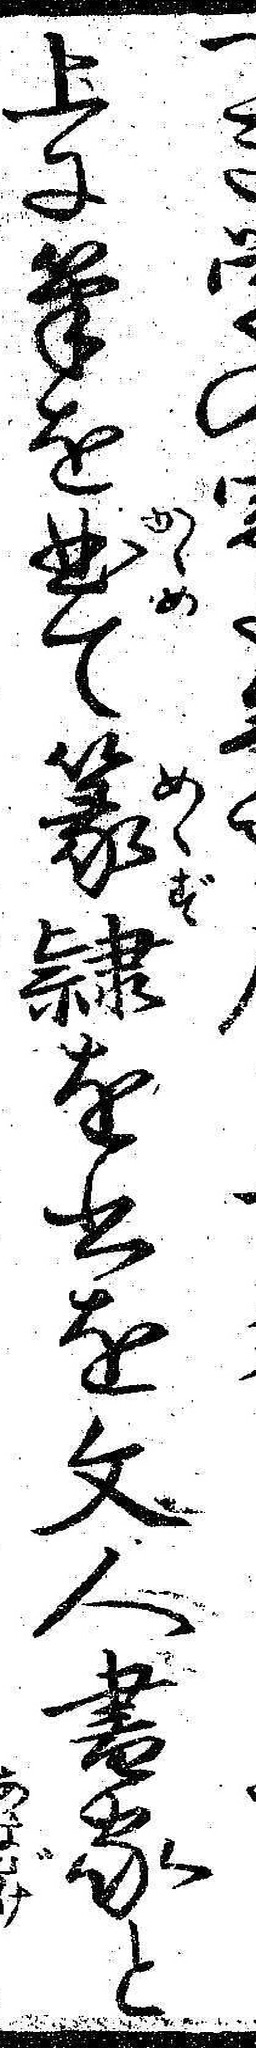上に筆を曲て篆隷を書を文人書家と
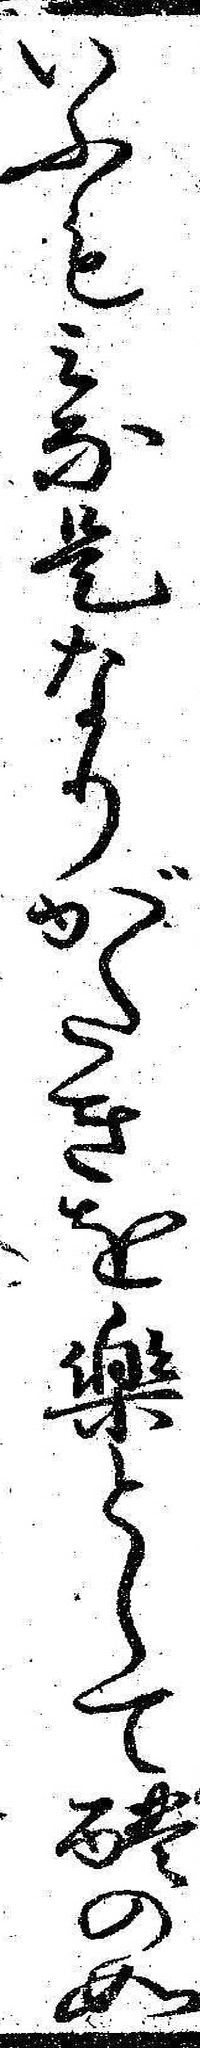いふもみな是なりがたきを楽として醴の如
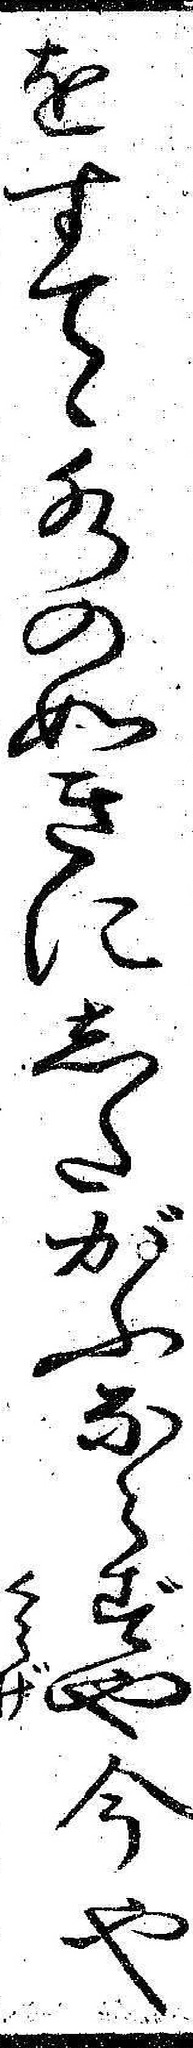をすてゝ水の如きにしたがふならずや今や
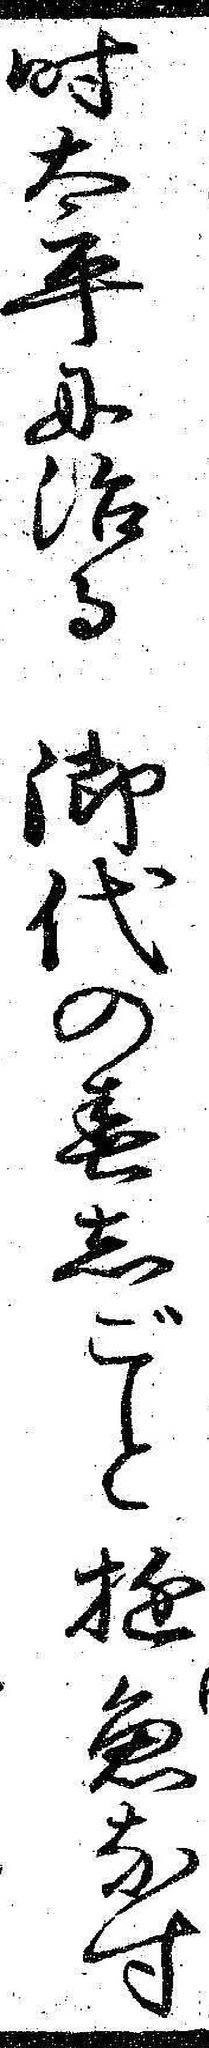時太平に治る御代の春しごと遊魚なす
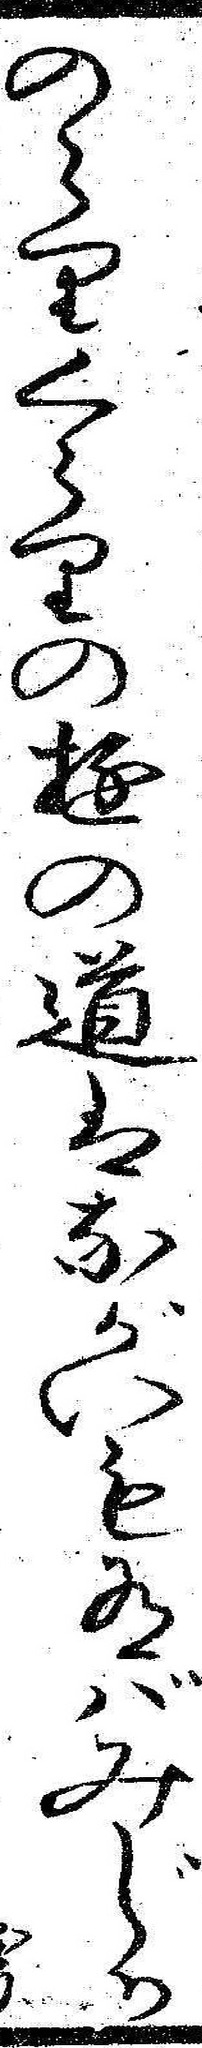のらりくらりの遊の道はながいも有ばみじか
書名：根無草後編
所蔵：国文学研究資料館
